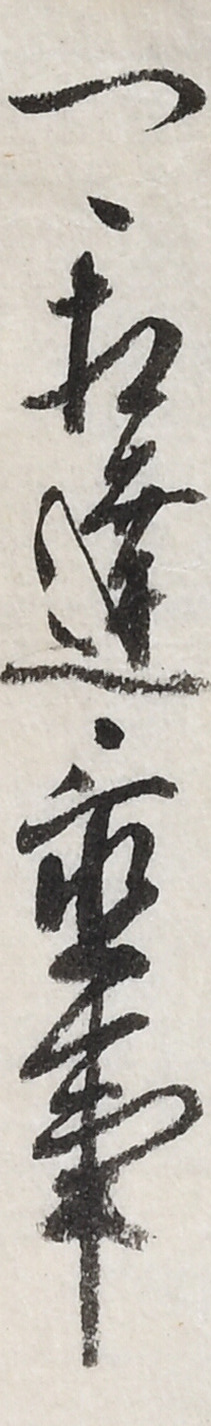可相達置事
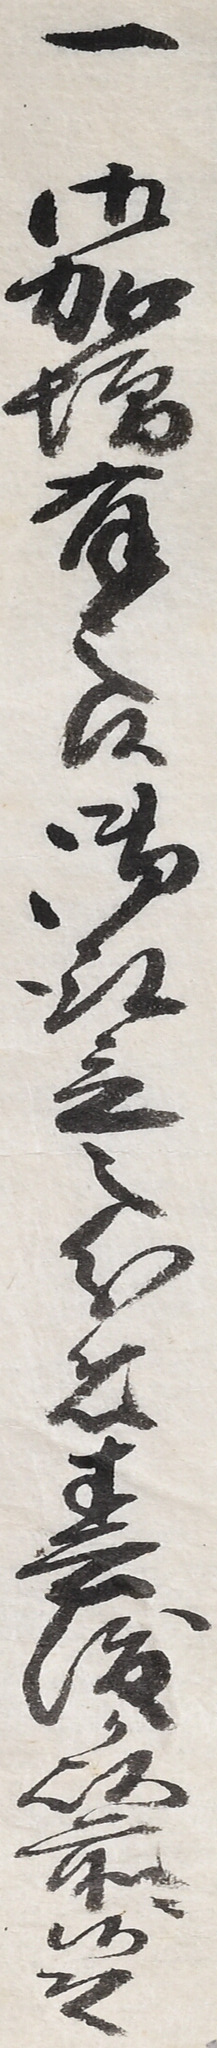一御加増有之候御取立之分は春後リ以前ニ候ハヽ
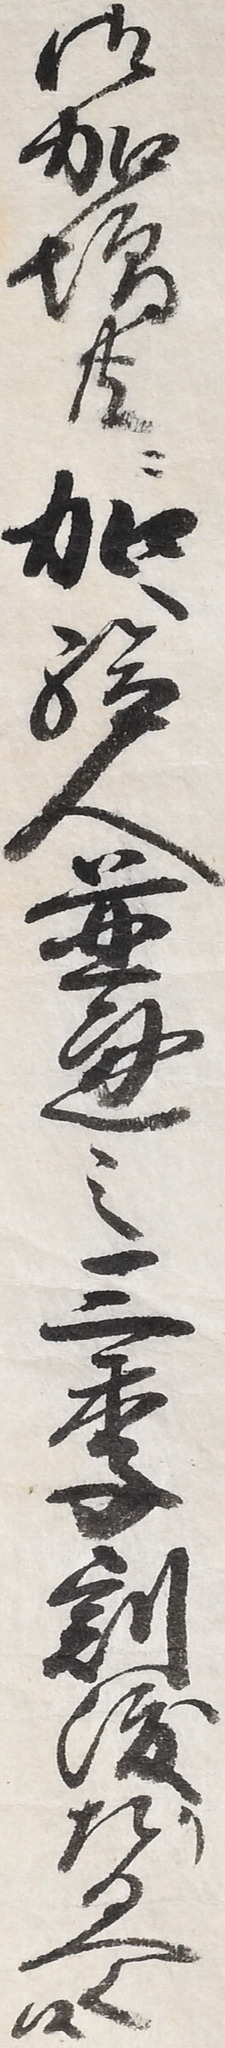御加増共ニ加へ給人並通之三季割渡リたるへく候
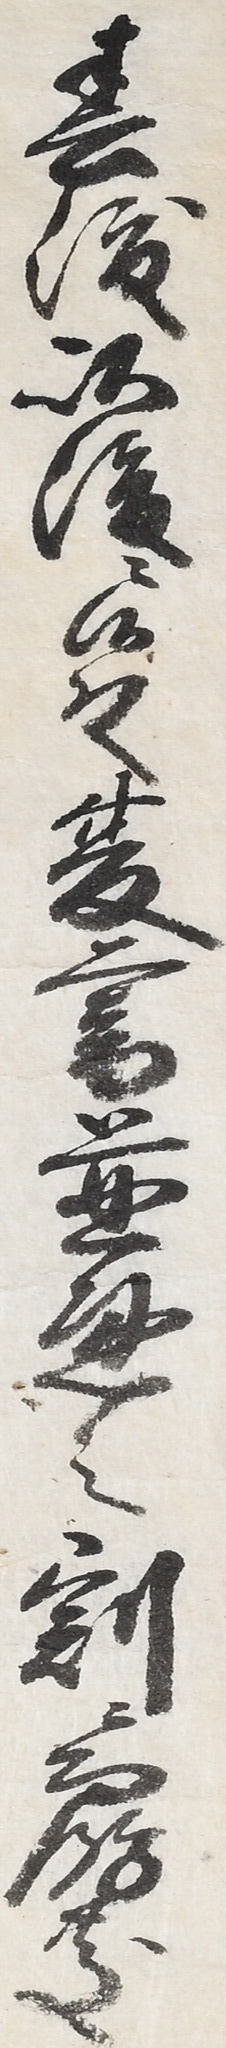春後以後ニ候ハヽ夏暮並通之割ニ而処
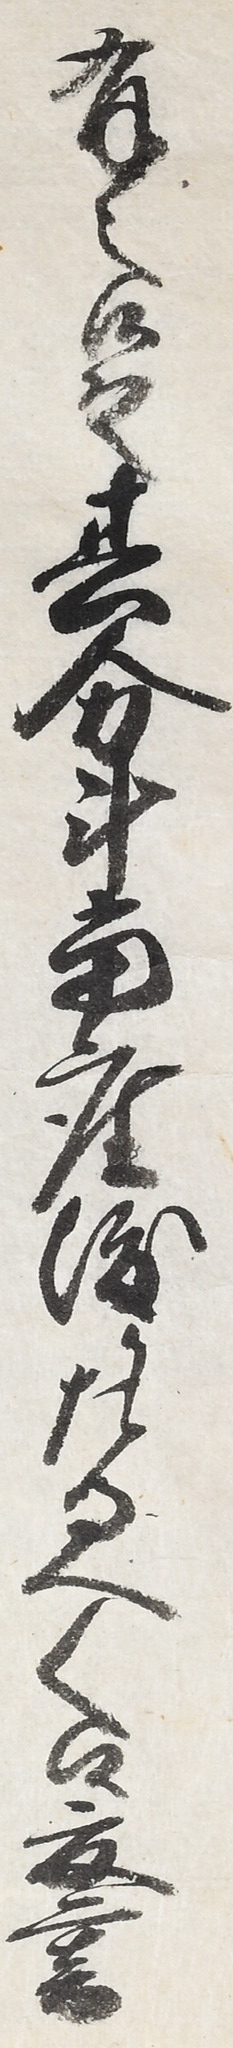有之候ハヽ其分計当座渡リたるへく候夏暮
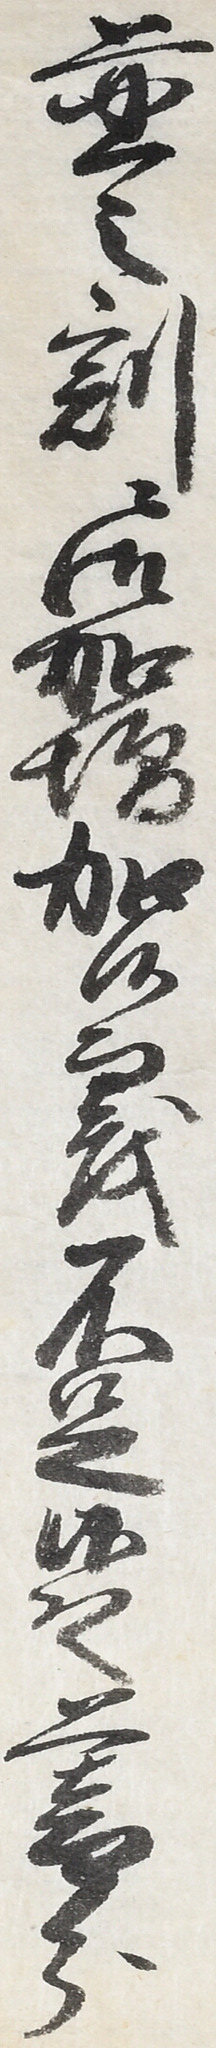並之割ニ御加増加候而も不足候ハヽ暮分
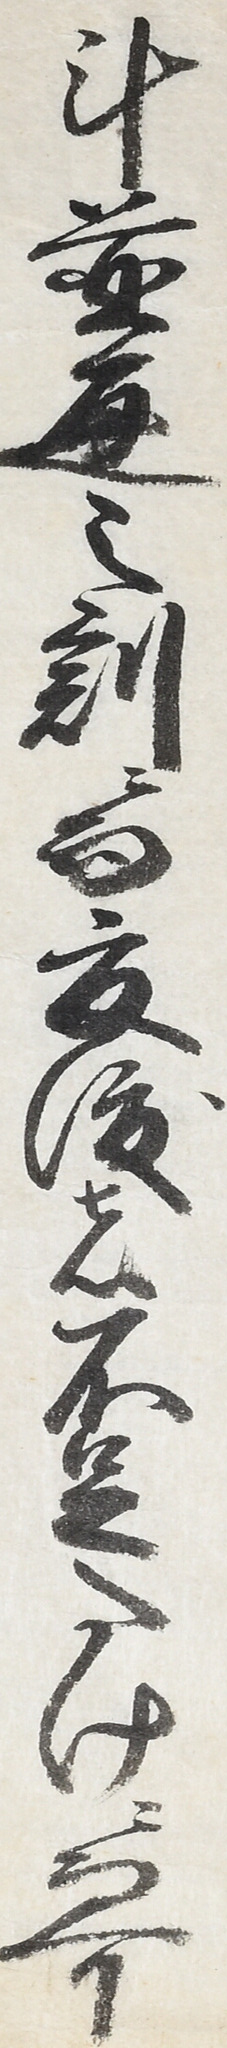計並通之割ニ而夏後者不足たけニ而可
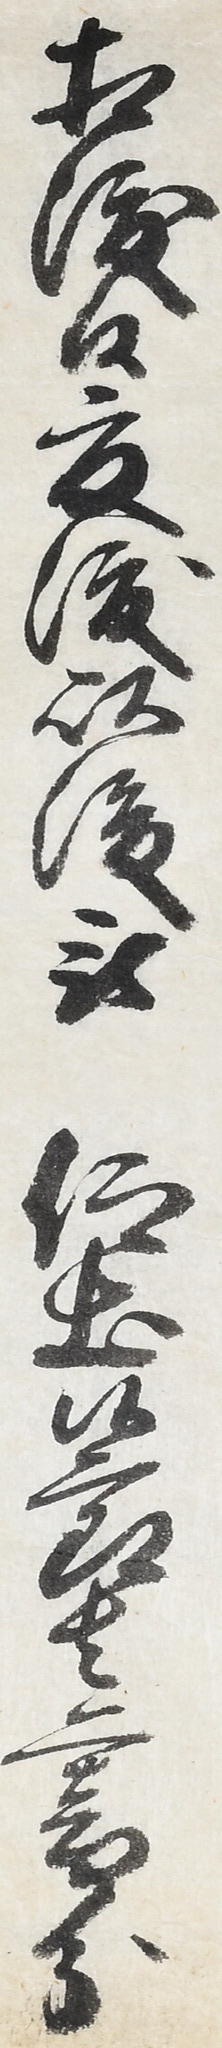相渡候夏後以後被仰出候節は暮分
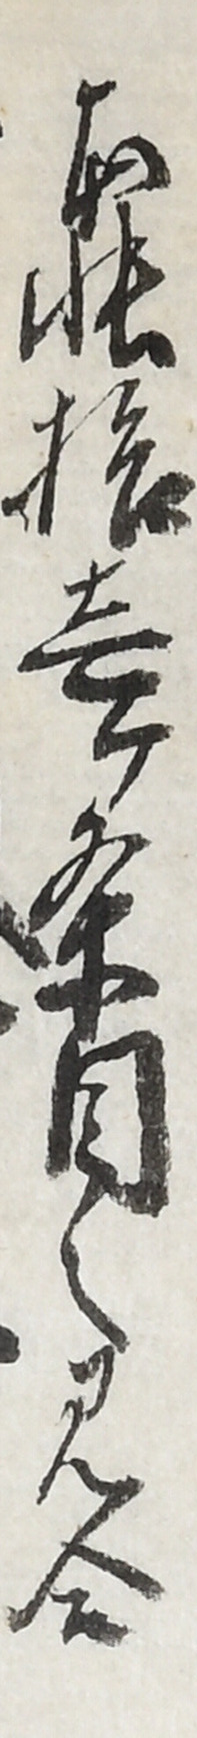本帳拾壱ヶ条目之見合
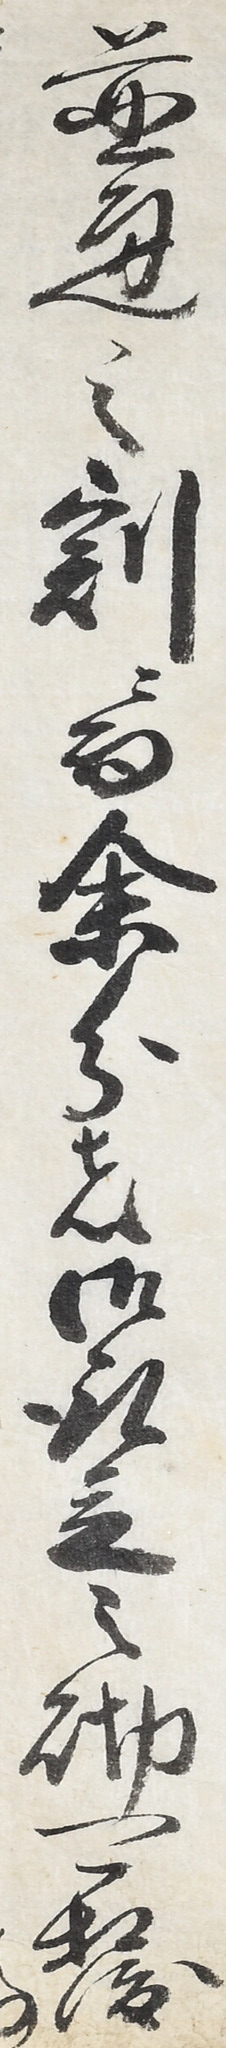並通之割ニ而余分は御取立之砌可相渡事
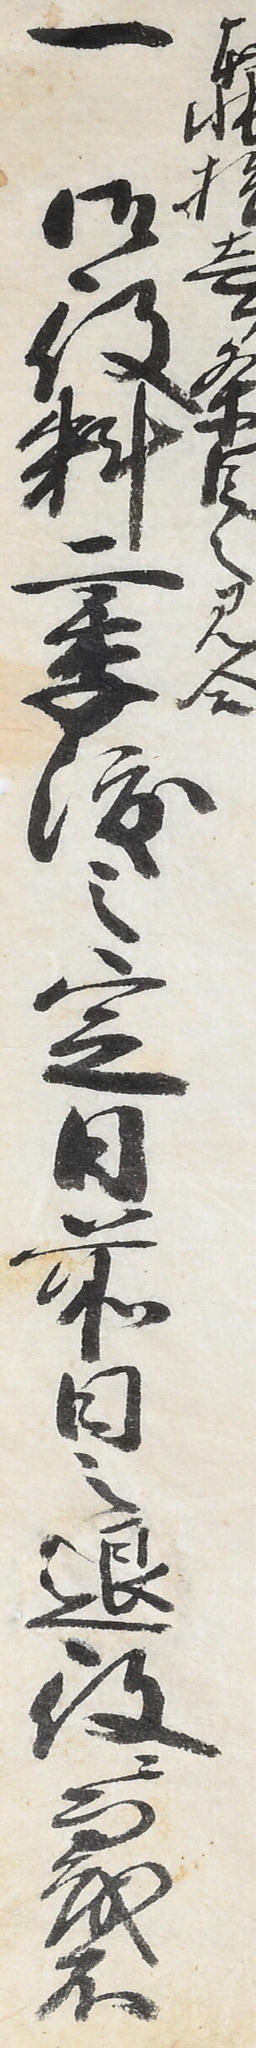一御役料二季後之定日前日之退役ニ而も不

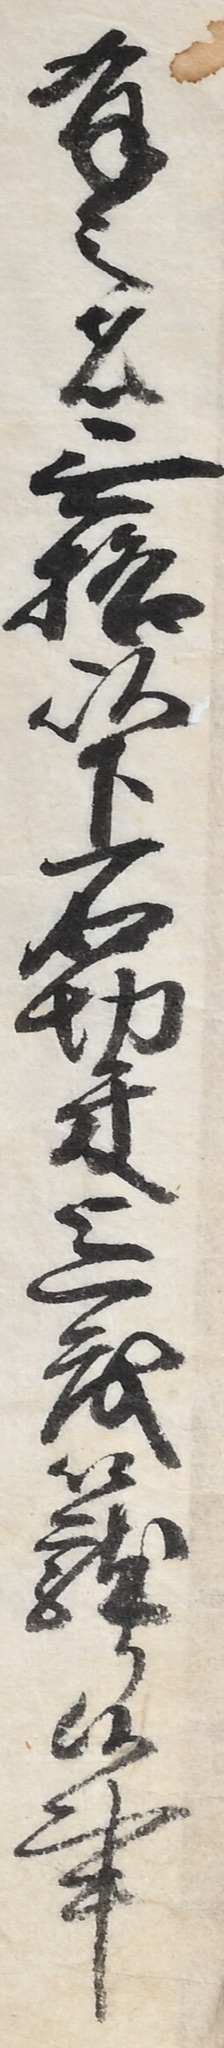有之は無格以下石切米迄も籠り候事
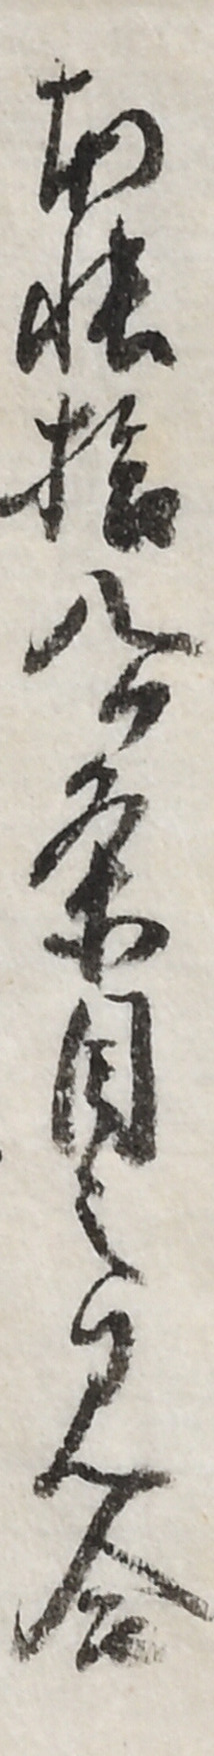本帳拾八ヶ条目之見合
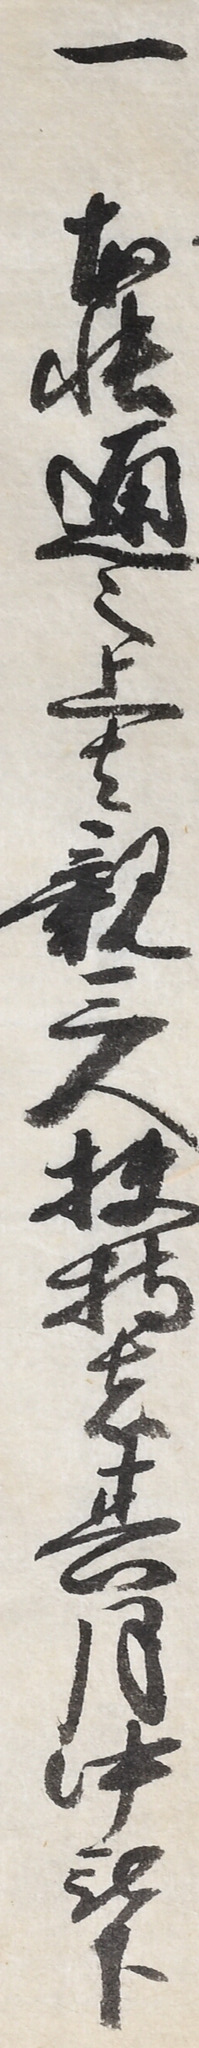一本帳通之上は親三人扶持は其月中被下
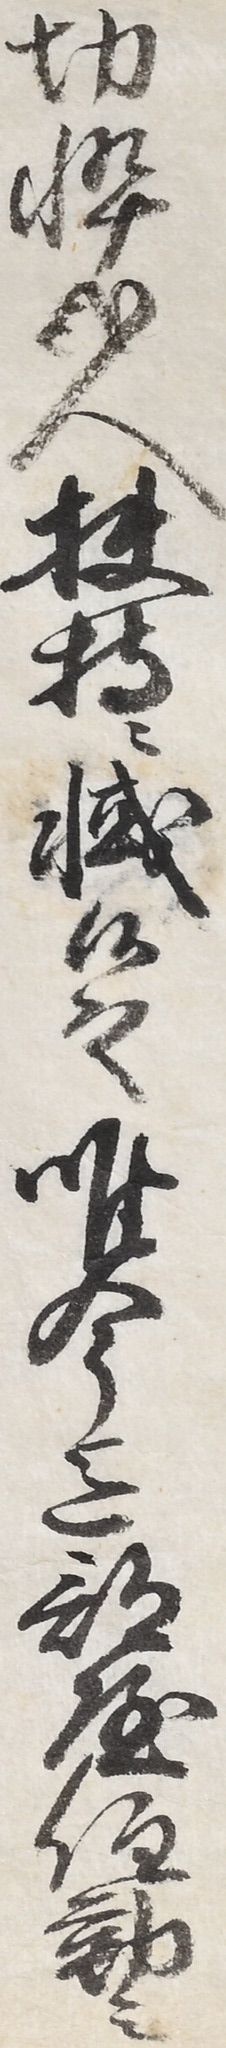切忰弐人扶持ニ減候ハヽ只今迄部屋住勤之
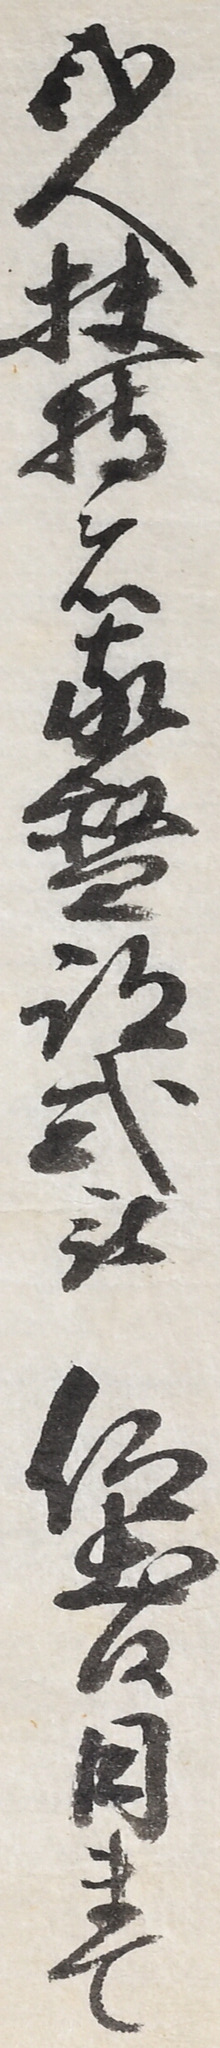弐人扶持は家督跡式被仰出候日まて
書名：御給分渡り方定追加
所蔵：伊那市立高遠町図書館・合同会社AMANE
